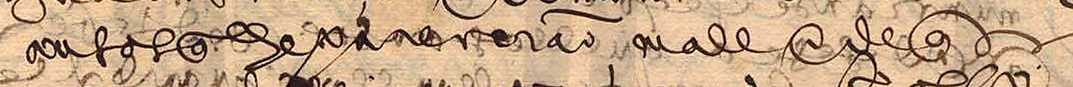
cousas q̄ lhe parecerão mall e de q̄ se
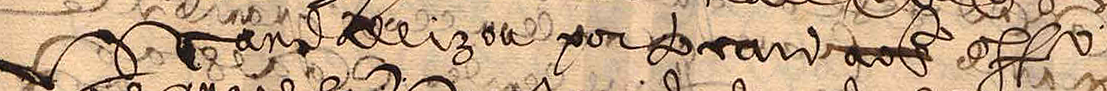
escandallizou por tocarē ao sto offo
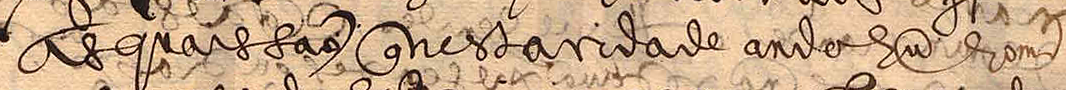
As quais saõ q̄ nesta cidade anda hū homē
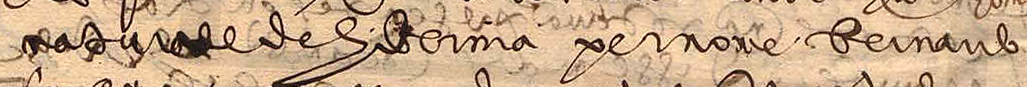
naturall de hibernia per nome bernando
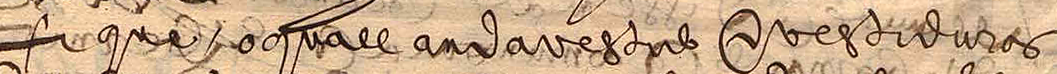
fique / o quall anda vestido ē vestiduras
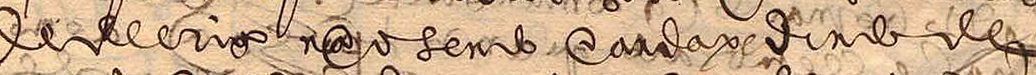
de cllerigo nā o sendo e anda pedindo de
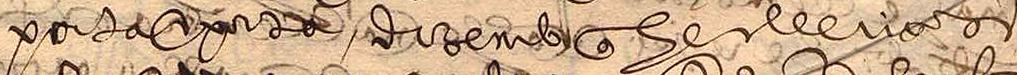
porta ē porta / dizemdo q̄ he cllerigo sē
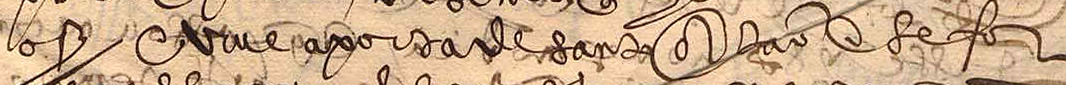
o ꞩ e viue a porta de santo Ātaõ e se for
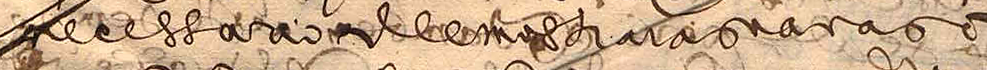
necessario elle mostrara sua casa
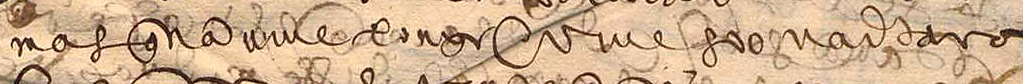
mas q̄ nā uiue longe e viue soo na dta ca
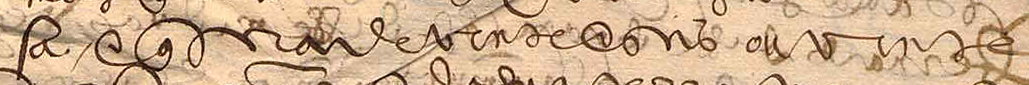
sa. / e q̄ sera de vinte e seis ou vinte
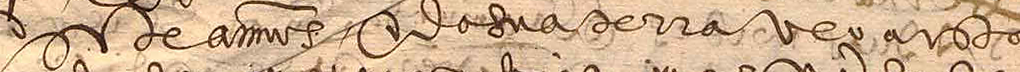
e sete annos / e da sua terra veo a esta
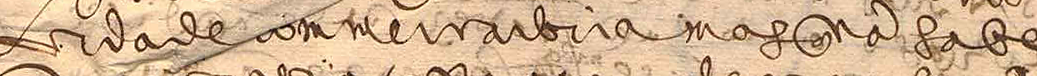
cidade com mercadoria mas q̄ nā sabe
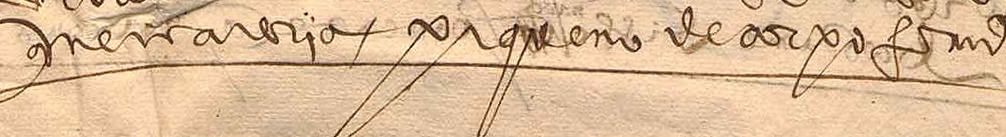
que mercadoria / piqueno de corpo homē
